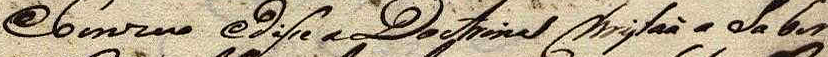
e benzeo e disse a Doctrina Christaã a Saber
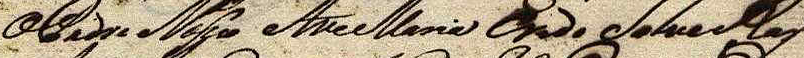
O Padre Nosso Ave Maria Credo Salve Ray
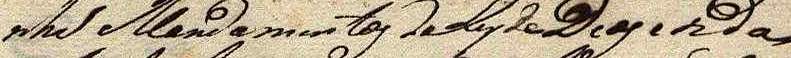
nha Mandamentos da Ley de Deos e os da
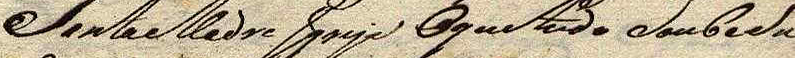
Santa Madre Igreja O que tudo soube su
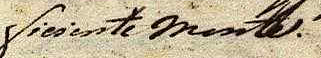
ficientemente.
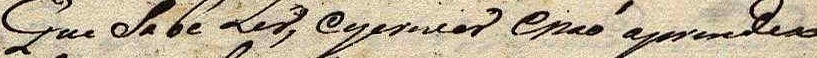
Que sabe Ler, e escrever e naõ aprendeo
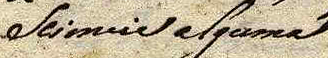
sciencia alguma
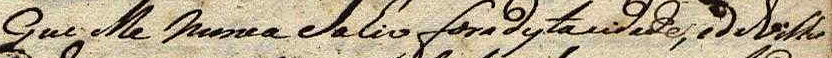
Que elle nunca sahio fora desta cidade, e da Villa
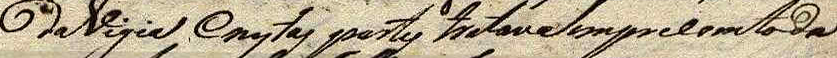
da Vigia e nestas partes tratou sempre com toda
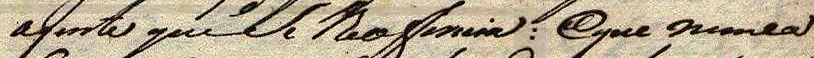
a gente que se lhe offerecia: e que nunca
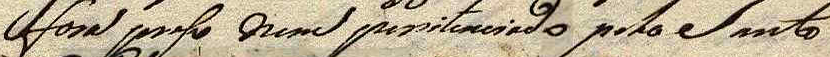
fora preso nem penitenciado pelo Santo
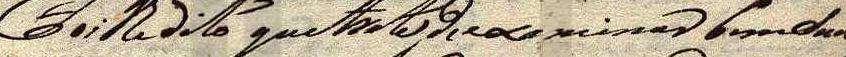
Foilhe dito que trate de examinar bem Sua
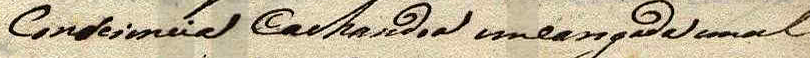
Consciencia e achandoa emcaregada em al
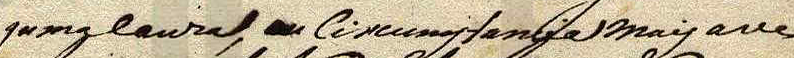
guma cauza, ou Circunstancia mais a ve
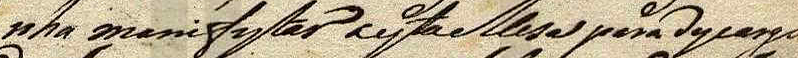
nha manifestar a esta Mesa para descargo
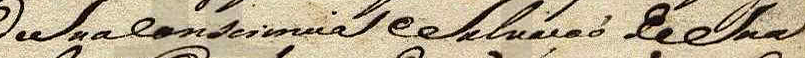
de Sua consciencia e Salvaçaõ de Sua
